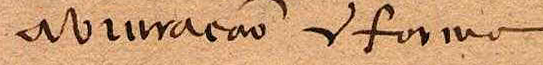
abiuraçaõ ē forma
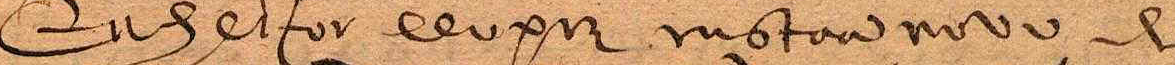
Eu heitor llopez cristaā novo de
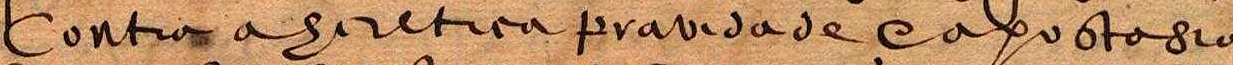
Contra a heretica pravidade e apostasia
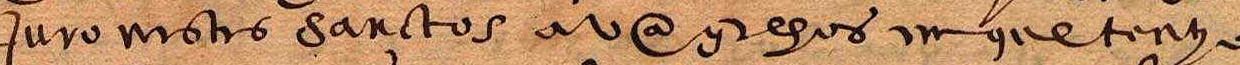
Juro nestes sanctos avāgelhos em que tenho
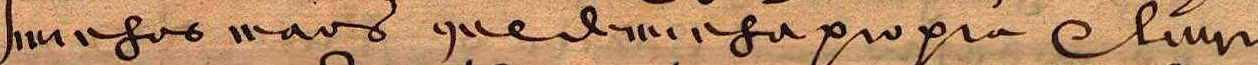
minhas maos que de minha propia e liure
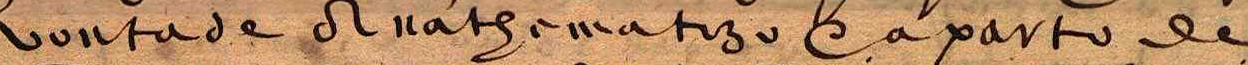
vontade Anathematizo e aparto de
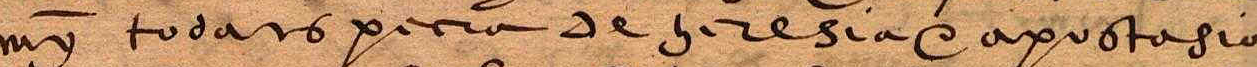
mȳ toda especia de heresia e apostasia
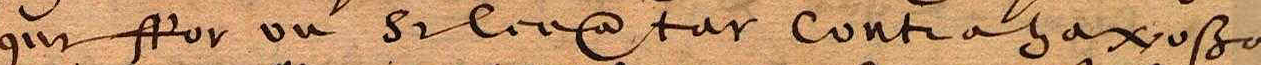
que ffor ou se leuātar contra ha nossa
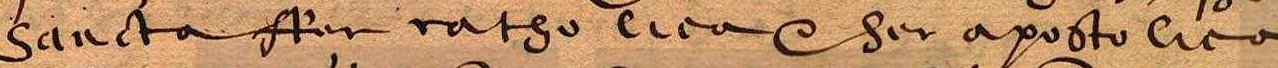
Sancta fee catholica e see apostolica
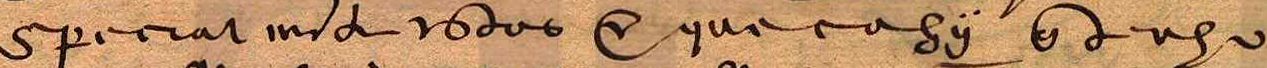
specialmēte estas ē que cahy q̄ tenho
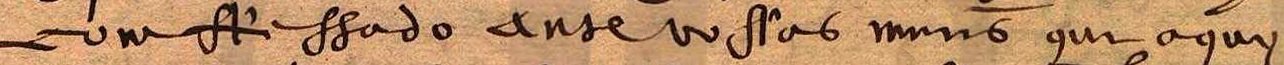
comffessado ante vossas merces̄ que aquy
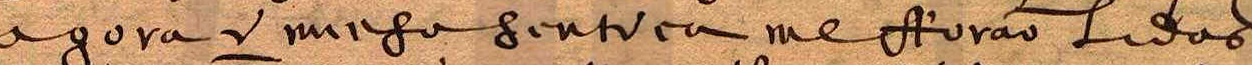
agora ē minha sentēça me fforaõ Lidas
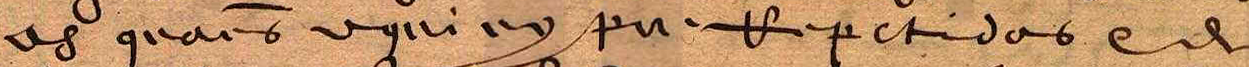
as quaēs aqui ey por Repetidas e de
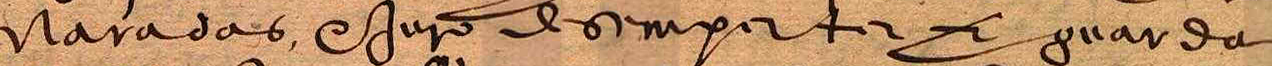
claradas, e Juro de semper ter e guardar
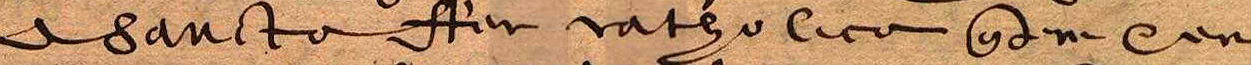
a sancta fee catholica q̄ tem e en
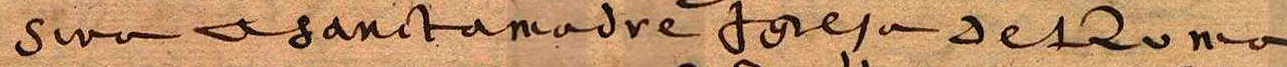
sina a sancta madre Jgreja de Roma
